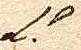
d.o
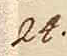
24.
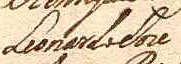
Leonardo Ioze
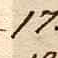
17.
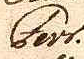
Fevr.o
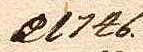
d̄ 1746.
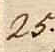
25.
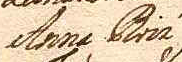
Anna Roiz̄
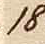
18.
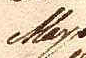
Mayo
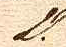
d.o
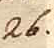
26.
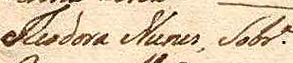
Theodora Nunes, Sobr.a
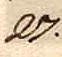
27.
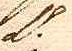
d.o
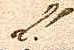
d.o
